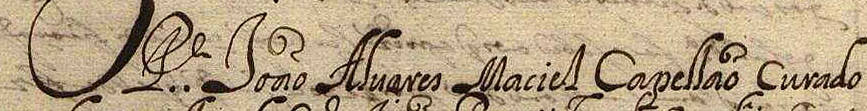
O P.e Ioão Aluares Maciel Capellaõ Curado
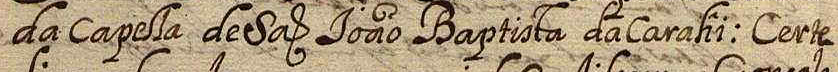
da Capella de Saõ Ioaõ Baptista da Carahi: Certe
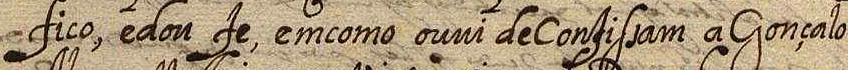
fico, e dou fe, em como ouui de Confissam a Gonçalo
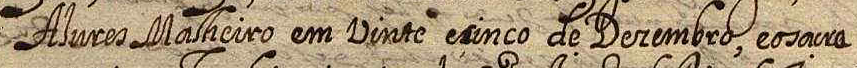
Alures Malheiro em vinte e sinco de Dezembro, e o sacra
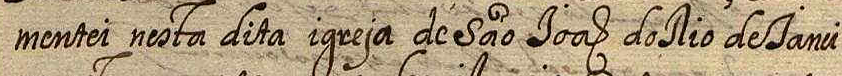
mentei nesta dita igreja de São Ioaõ do Rio de Ianei
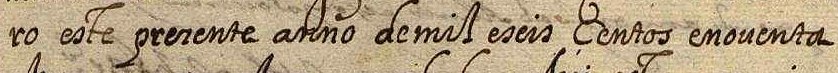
ro este prezente anno de mil e seisCentos e nouenta
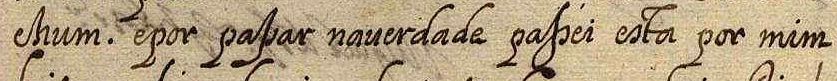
e hum. e por passar na uerdade passei esta por mim
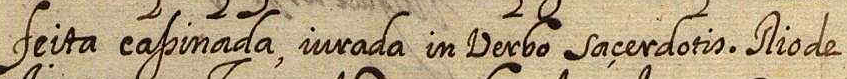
feita e assinada, iurada in verbo sacerdotis. Rio de
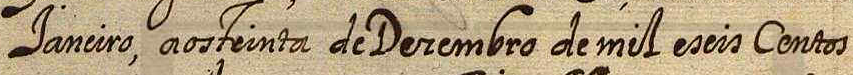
Ianeiro, aos trinta de Dezembro de mil e seisCentos
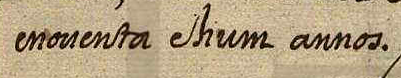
e nouenta e hum annos.
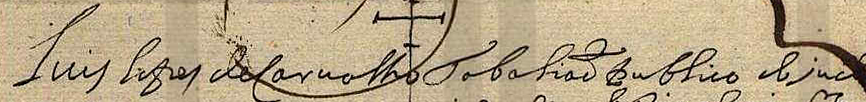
Luis Lopes de Carualho Tabaliaõ publico ab judi
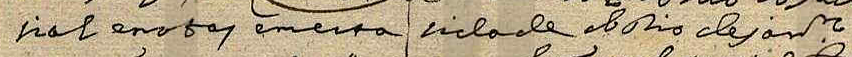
sial e notas em esta cidade do Rio de janro
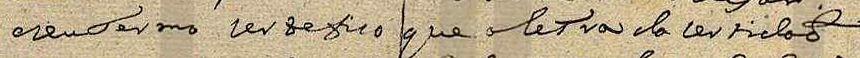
e seu Termo sertefico que a letra da certidaõ
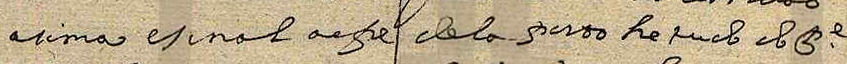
asima e sinal ao pe dela perto he tudo do P.e
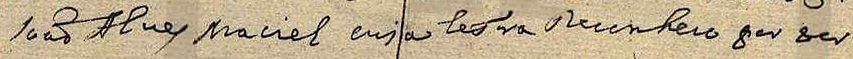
Ioaõ Alues Maciel cuja letra Reconheço por ter
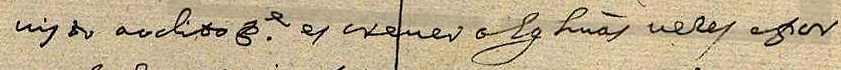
uisto ao dito p.e escreuer aly huās uezes e por
